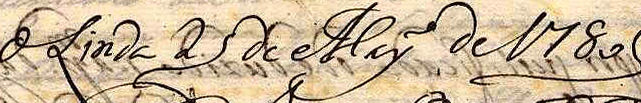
OLinda 2 de Mayo de 1780
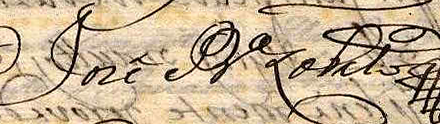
Jozé Pr.a Lobato
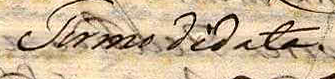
Termo de data
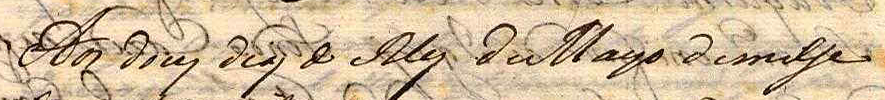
Aos dous dia do Mes de Mayo de mil se
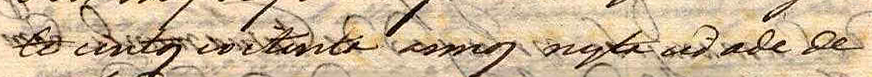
tecentos e oitenta annos nesta cidade de
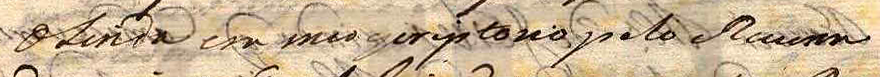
OLinda em meo escriptorio pelo Reueren
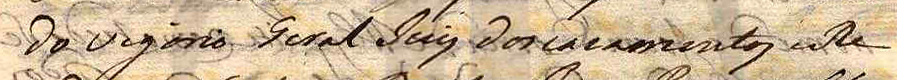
do vigario Geral Iuis dos casamentos e Re
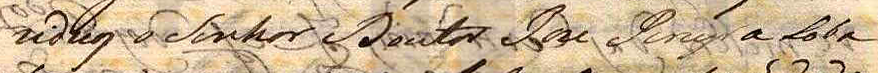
ziduos o Senhor Doutor Ioze Pereyra Loba
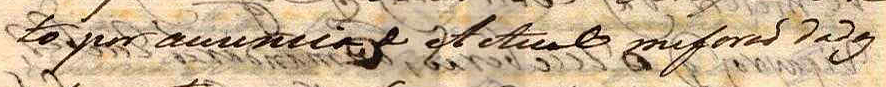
to por auzencia do Actual me foraõ dados
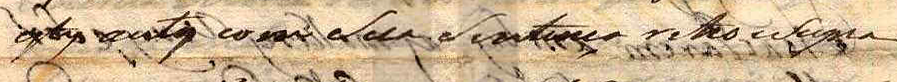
estes autos com sua Sentença retro e supra
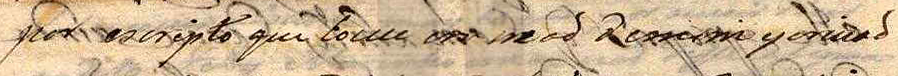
por escripto que touce em maõ de mim escriuaõ
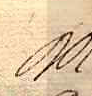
RR
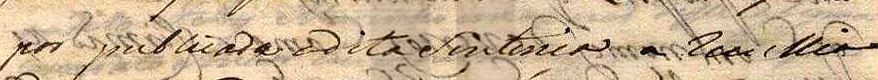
por publicada a dita sentença a Reuellia
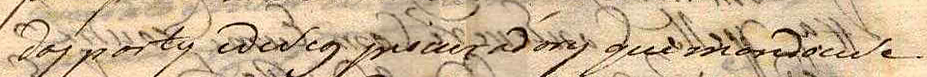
das partes e de seos procuradores que mandou se
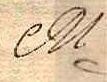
M.
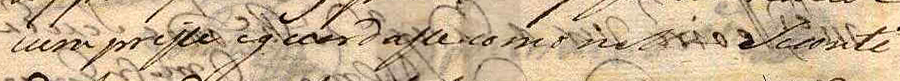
cumprisse e guardasse como nella se contē
